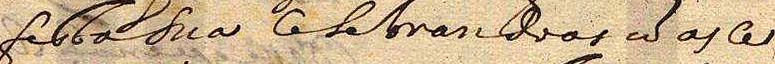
festa sua celebrandoas cō as ce
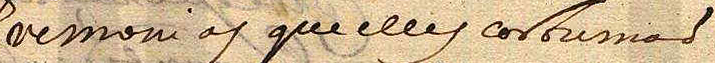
remonias que elles costumaõ
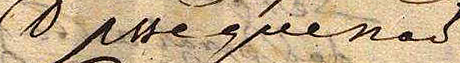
Disse que naõ
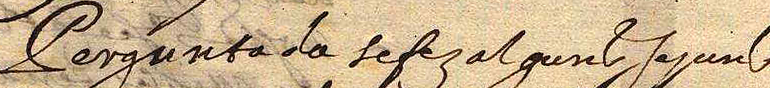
Perguntada se fez alguns Jejuns
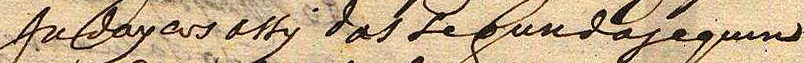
Judaycos assy das segundas e quin
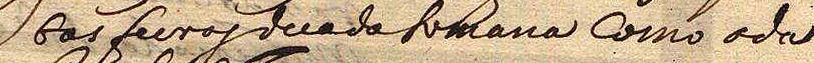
tas feiras de cada somana como o da
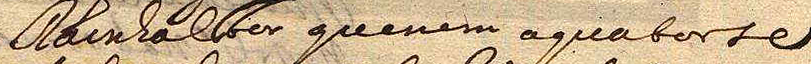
Rainha Ester que uem a quatorse
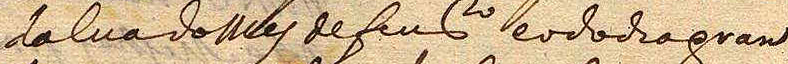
da lua do Mes de feuro e o do dia gran
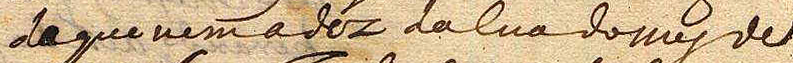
de que uem a dez da lua do mes de
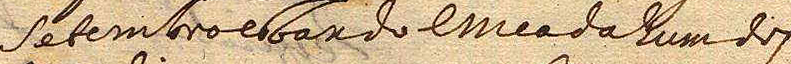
Setembro estando em cada hum dos
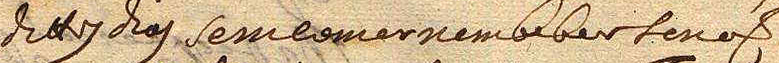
dittos dias sem comer nem beber senaõ
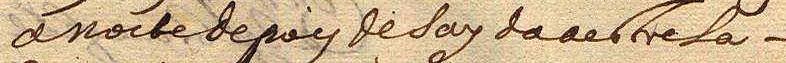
a noite depois de sayda a estreLa
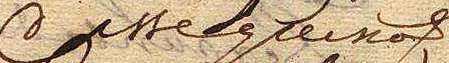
Disse que naõ
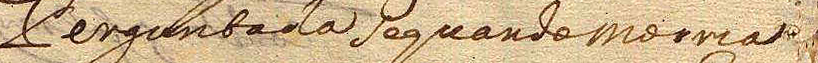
Perguntada se quando morria
